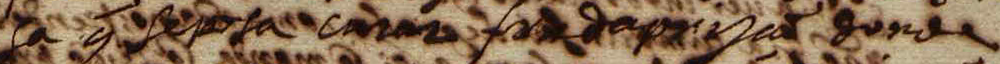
sa q̄ se posa curar fora da prizaõ donde
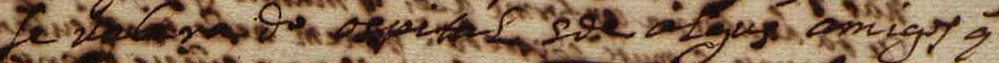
se ualera do ospital E de algus̄ amigos q̄
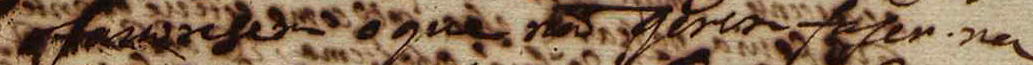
o fauoresem o que naõ qerem fazer na
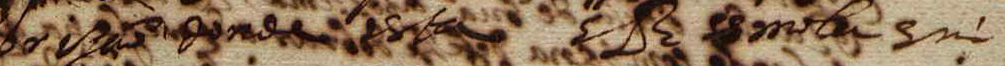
prizaõ donde esta E R Esmola E m̄
